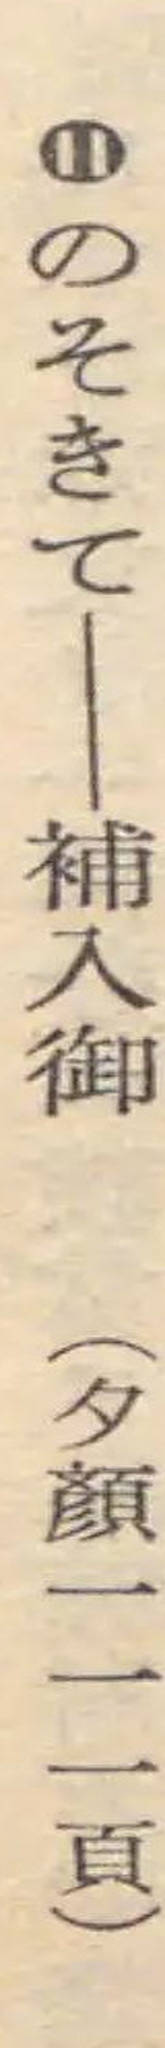⓫のそきて──補入御(夕顔一一一頁)
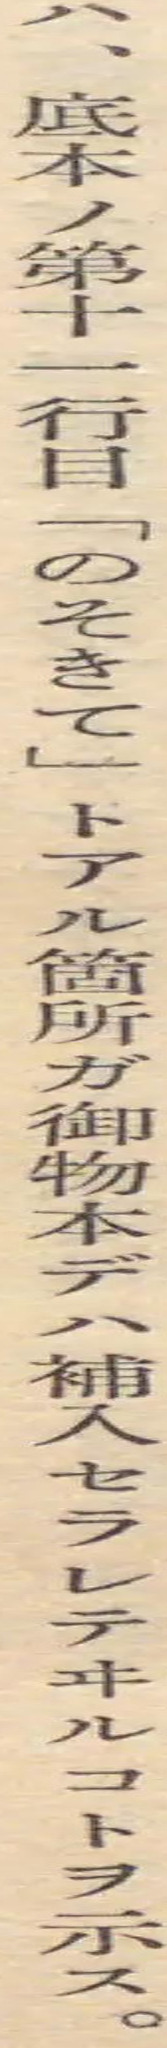ハ、底本ノ第十一行目「のそきて」トアル箇所ガ御物本デハ補人セラレテヰルコトヲ示ス。
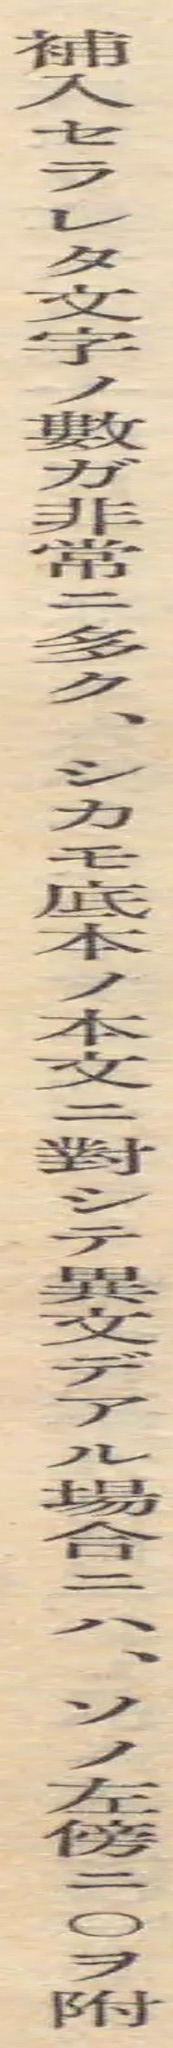補入セラレタ文字ノ数ガ非常ニ多ク、シカモ底本ノ本文ニ対シテ異文デアル場合ニハ、ソノ左傍ニ○ヲ附
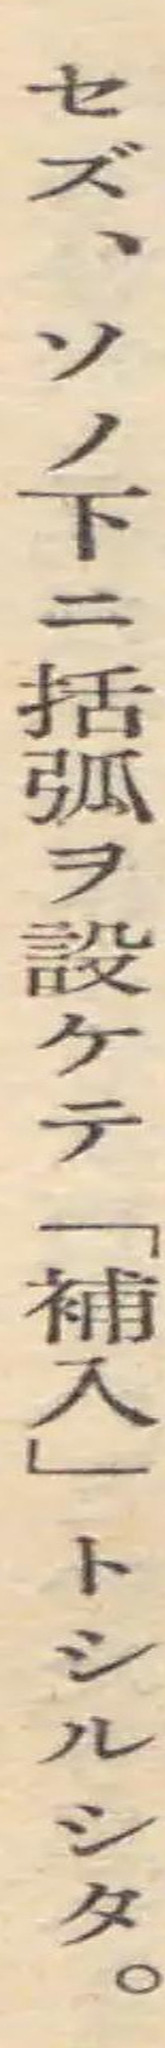セズ、ソノ下ニ括弧ヲ設ケテ「補入」トシルシタ。
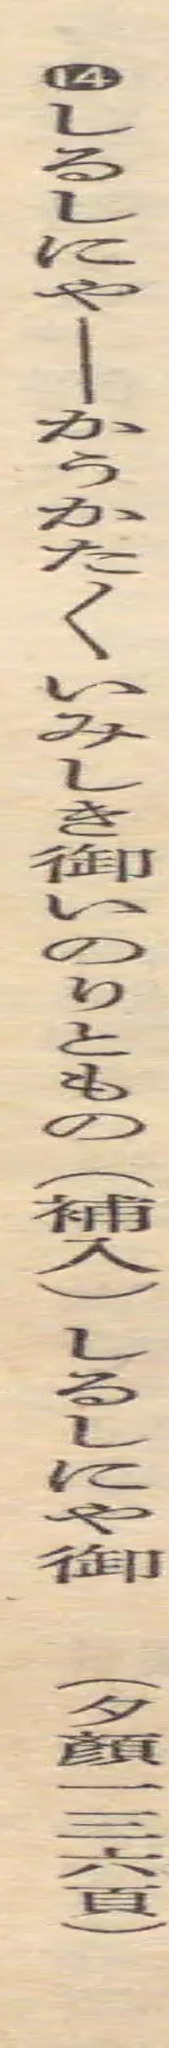⓮しるしにや──かうかた〳〵いみしき御いのりともの(補人)しるしにや御(夕顔一三六頁)
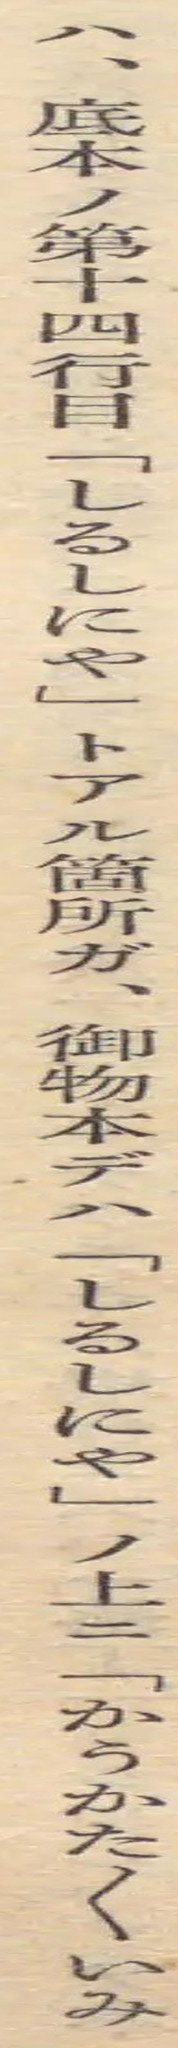ハ、底本ノ第十四行目「しるしにや」トアル箇所ガ、御物本デハ「しるしにや」ノ上ニ「かうかた〳〵いみ
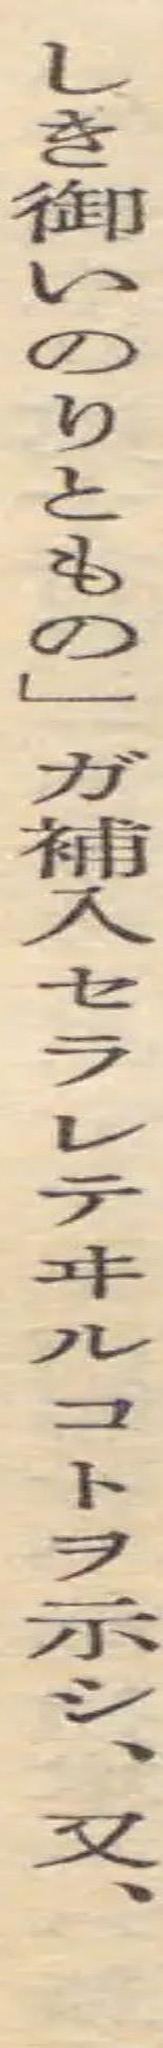しき御いのりともの」ガ補入セラレテヰルコトヲ示シ、又、
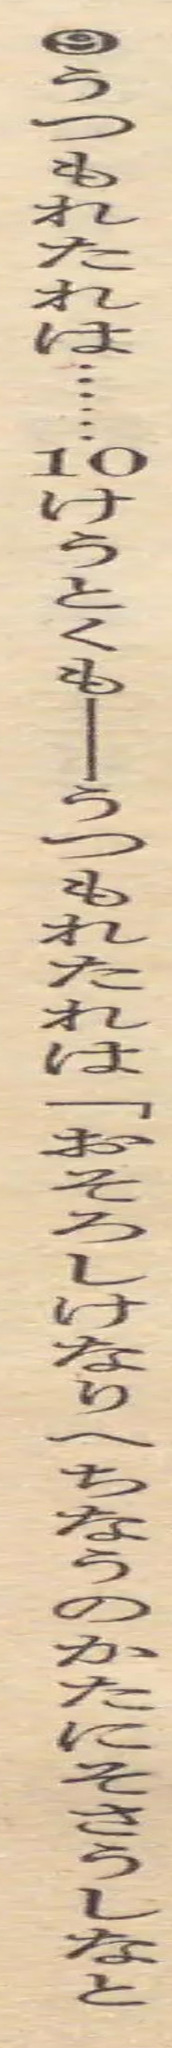❾うつもれたれは……けうとくも──うつもれたれは「おそろしけなりへちなうのかたにそさうしなと
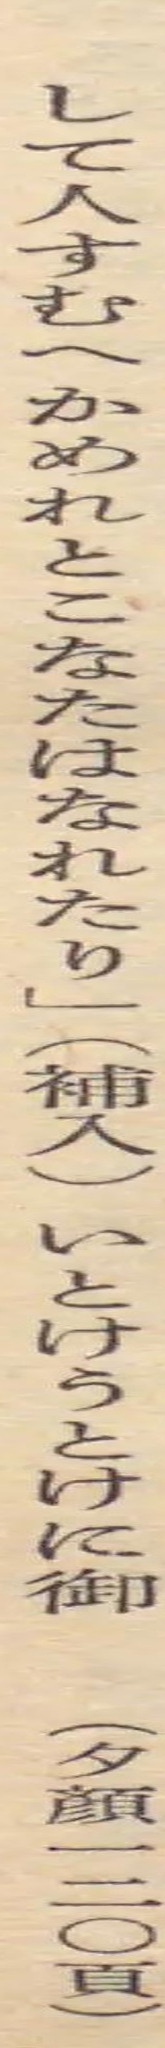して人すむへかめれとこなたはなれたり」(補入)いとけうとけに御(夕顔一二〇頁)
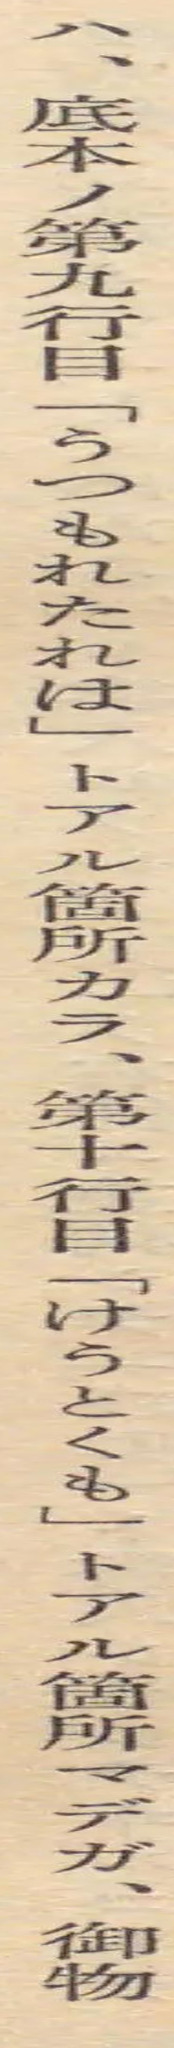ハ、底本ノ第九行目「うつもれたれは」トアル箇所カラ、第十行目「けうとくも」トアル箇所マデガ、御物
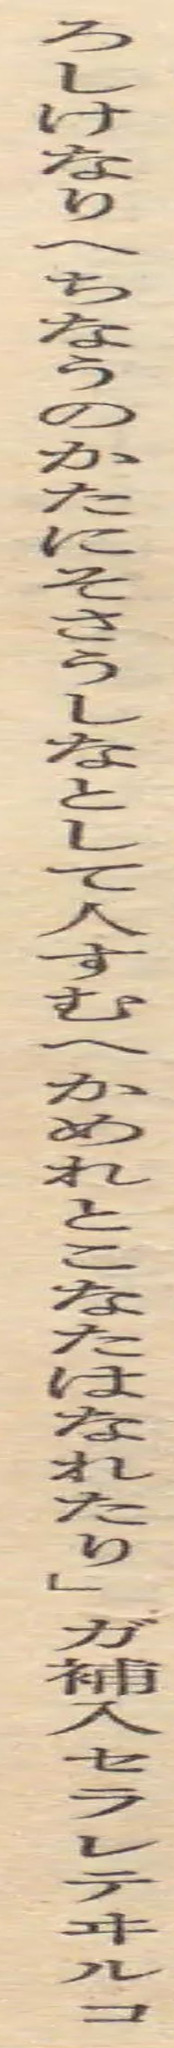ろしけなりへちなうのかたにそさうしなとして人すむへかめれとこなたはなれたり」ガ補入セラレテヰルコ
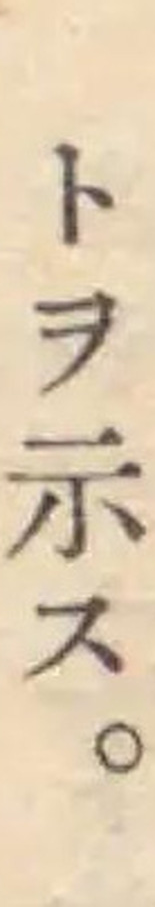トヲ示ス。
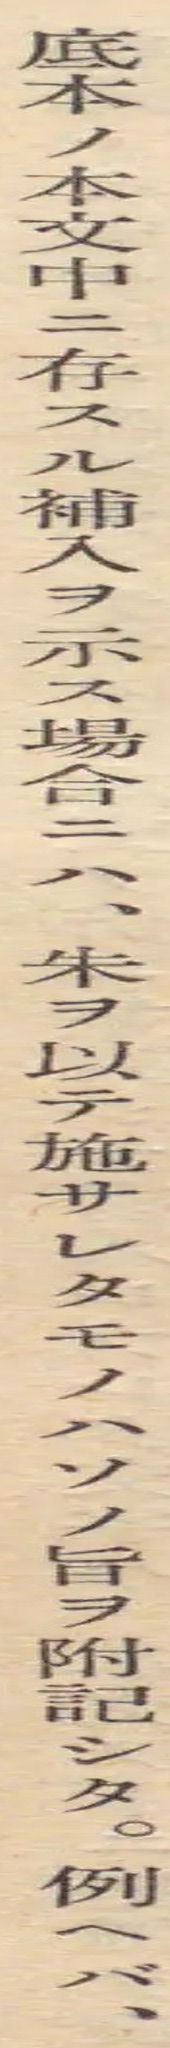一底本ノ本文中ニ存スル補入ヲ示ス場合ニハ、朱ヲ以テ施サレタモノハソノ旨ヲ附記シタ。例ヘバ、
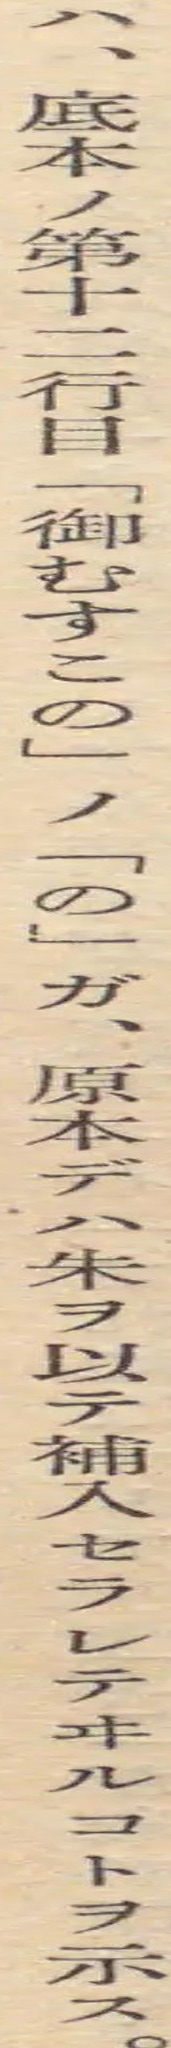ハ、底本ノ第十二行目「御むすこの」ノ「の」ガ、原本デハ朱ヲ以テ補入セラレテヰルコトヲ示ス。
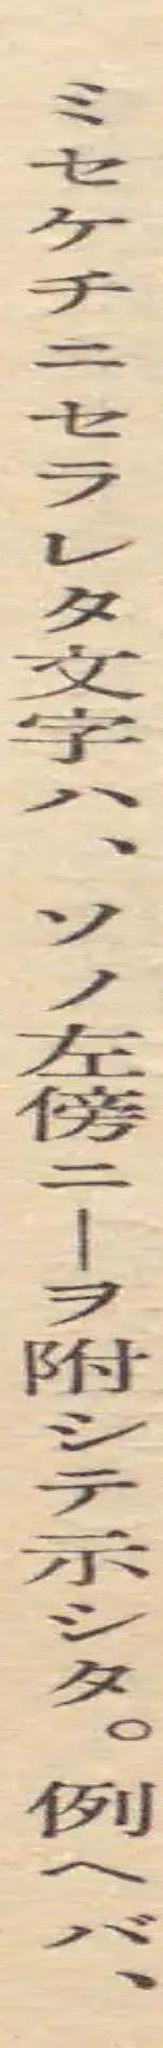一ミセケチニセラレタ文字ハ、ソノ左傍ニ─ヲ附シテ示シタ。例ヘバ、
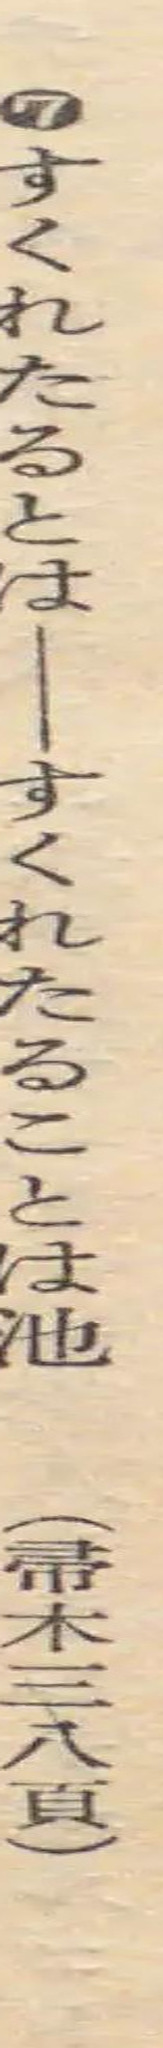❼すくれたるとは──すくれたることは池(帚木三八頁)
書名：校異源氏物語.
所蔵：国立国会図書館 National Diet Library, JAPAN
